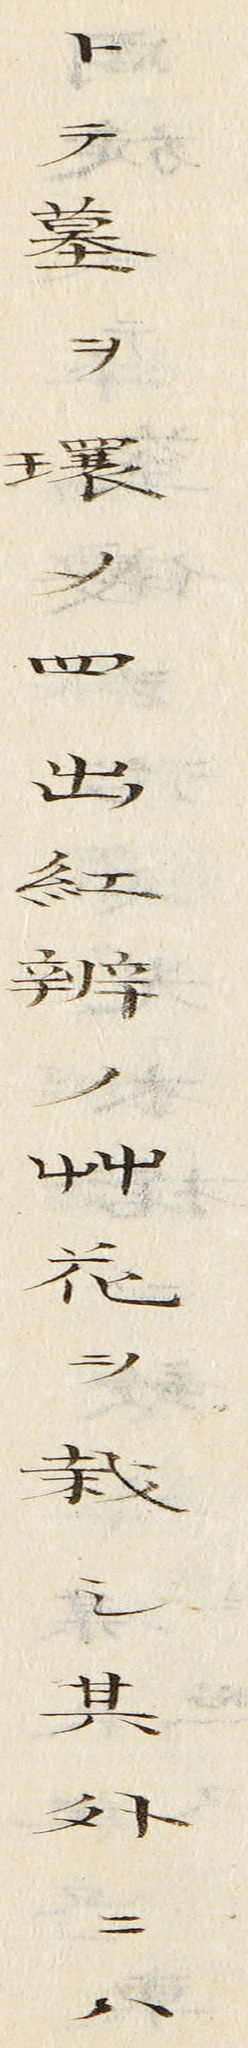トテ墓ヲ環シテ四出紅弁ノ草花ヲ栽シ其外ニハ
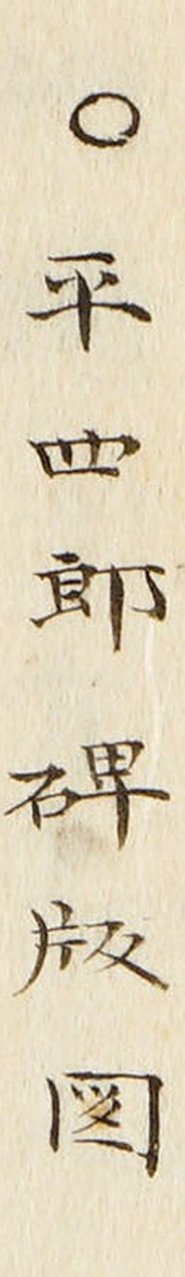◦平四郎碑版図
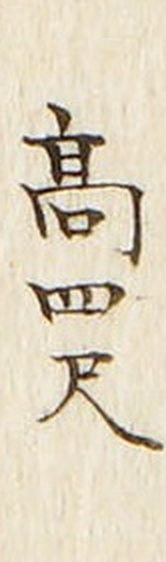高四尺
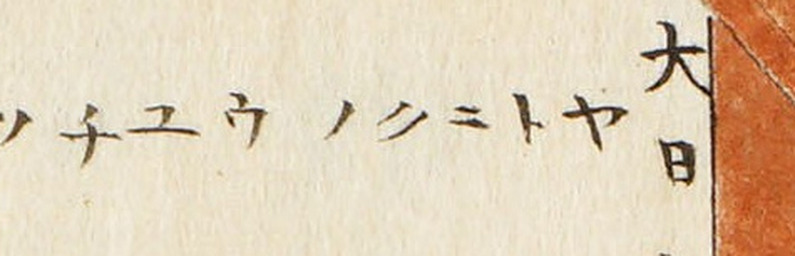ヱツチユウノクニトヤ
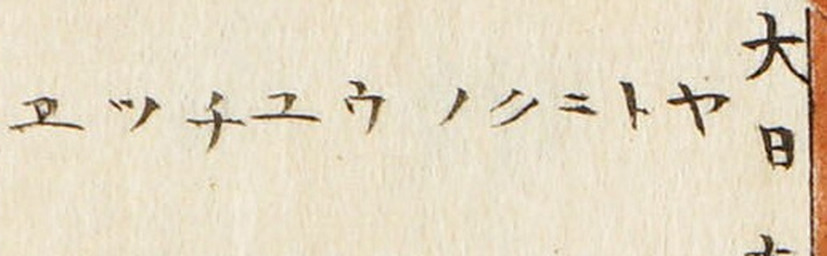ヱツチユウノクニトヤ
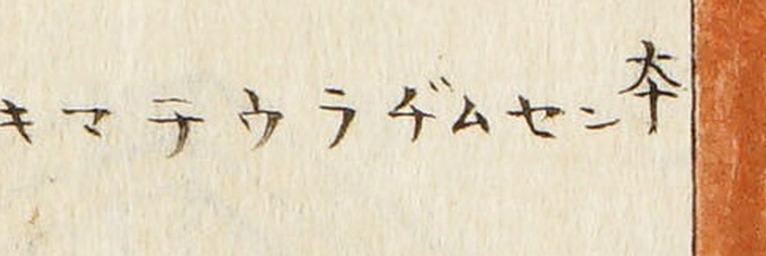マキマチウラヂムセン
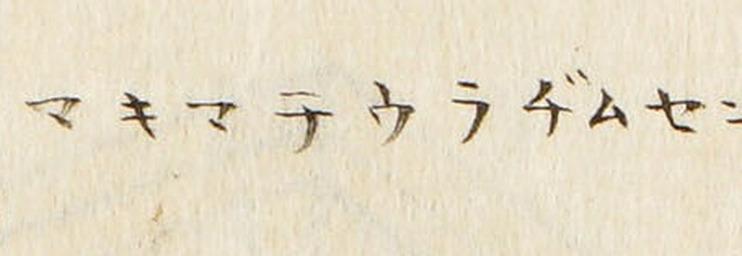マキマチウラヂムセン
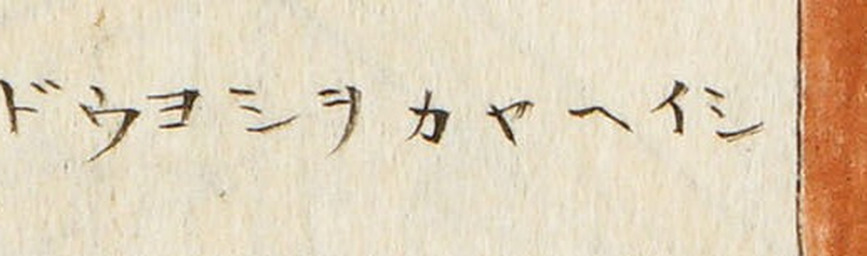ドウヨシヲカヤヘイシ
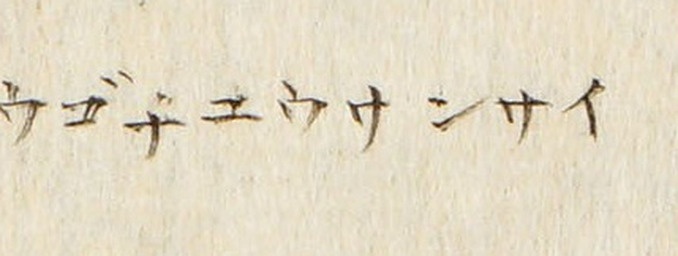ロウゴチユウサンサイ
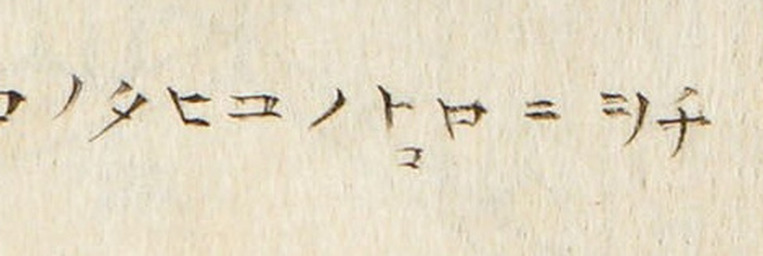コノタヒコノトコロニヲチ
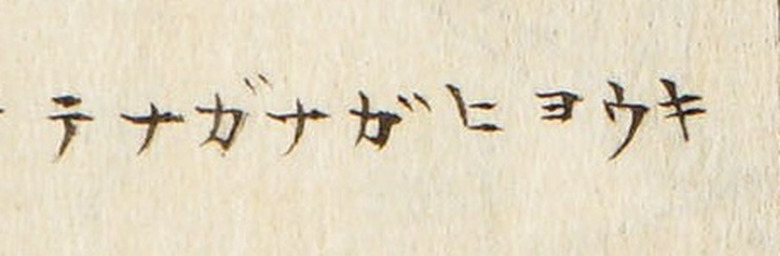キテナガナガヒヨウキ
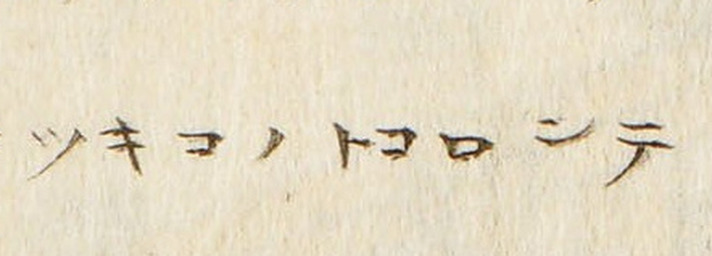ニツキコノトコロニテ
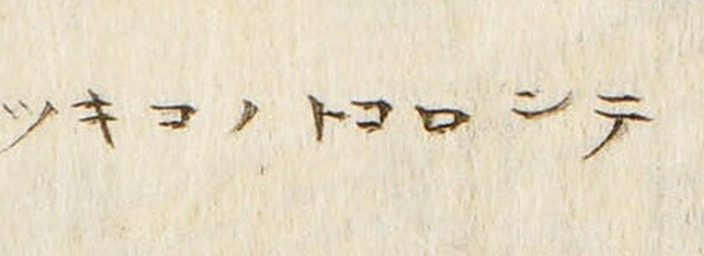ニツキコノトコロニテ
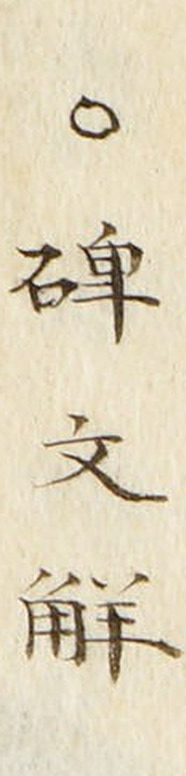◦碑文解
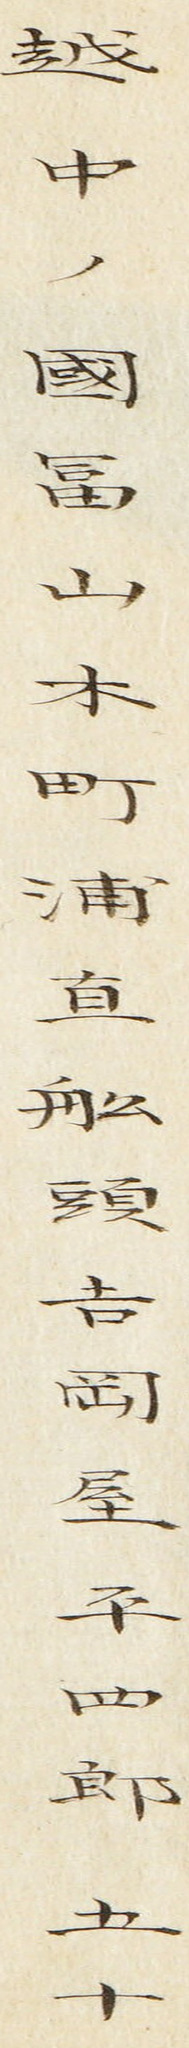越中ノ国冨山木町浦直舩頭吉岡屋平四郎五十
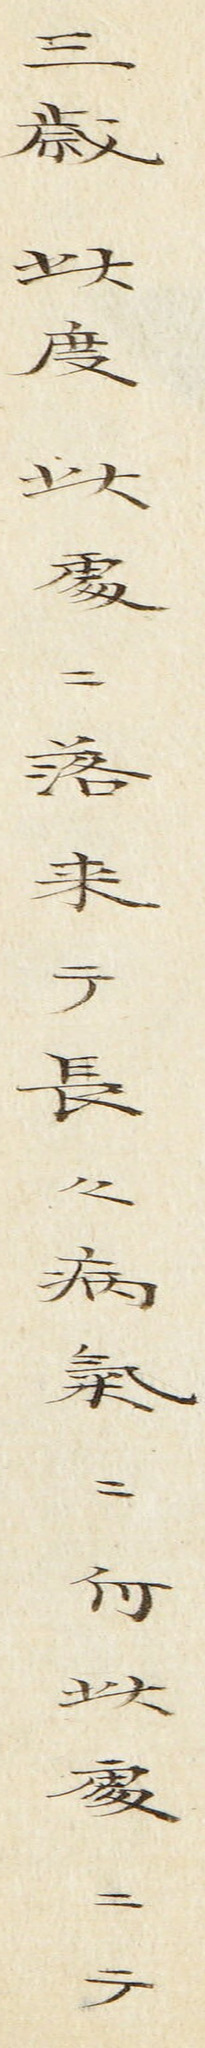三歳此度此処ニ落来テ長々病気ニ付此処ニテ
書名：蕃談
